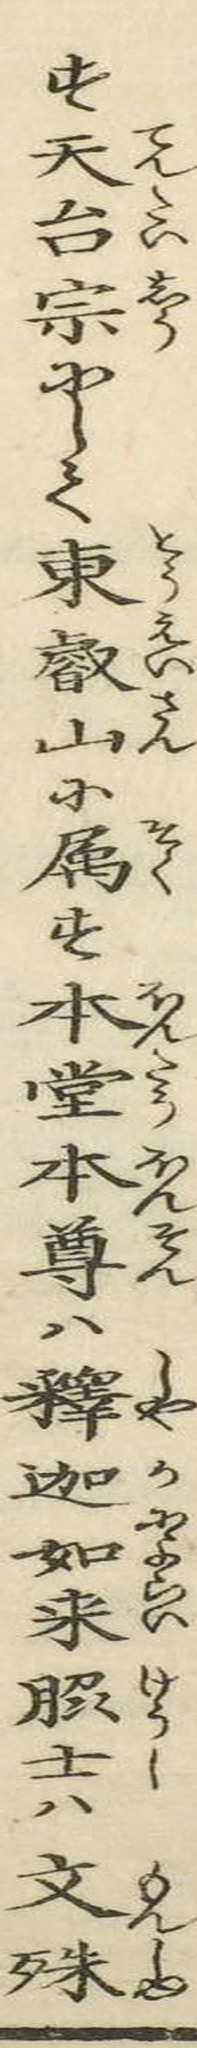す天台宗にして東叡山に属す本堂本尊は釋迦如来𦚰士は文殊
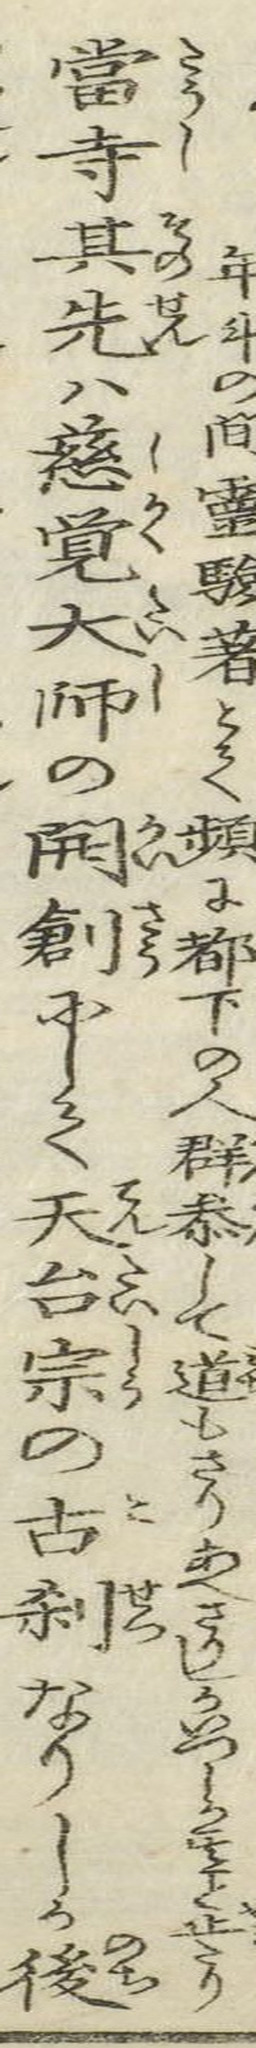當寺其先は慈覚大師の開創にして天台宗の古刹なりしか後
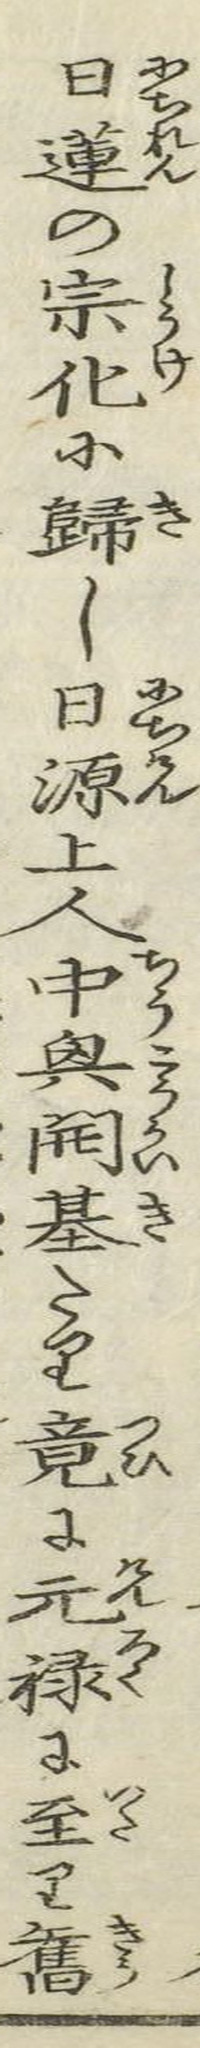日蓮の宗化に歸し日源上人中興開基たり竟に元禄に至り𦾔
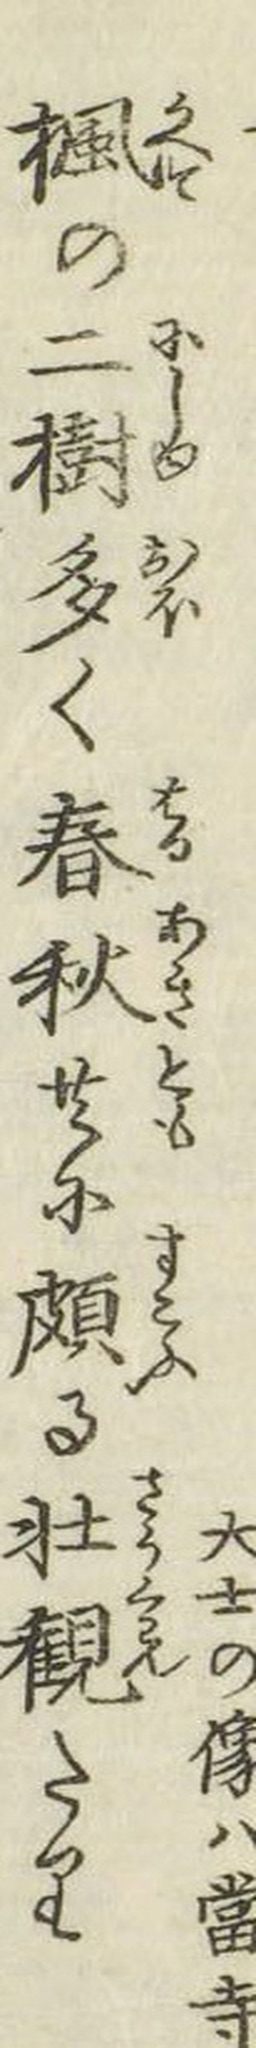楓の二樹多く春秋共に頗る壮観たり
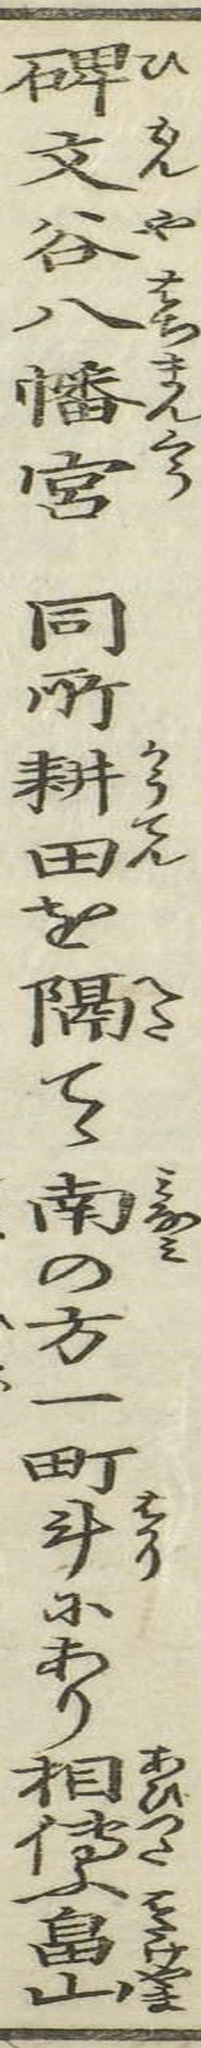碑文谷八幡宮同所耕田を隔てゝ南の方一町斗にあり相傳ふ畠山
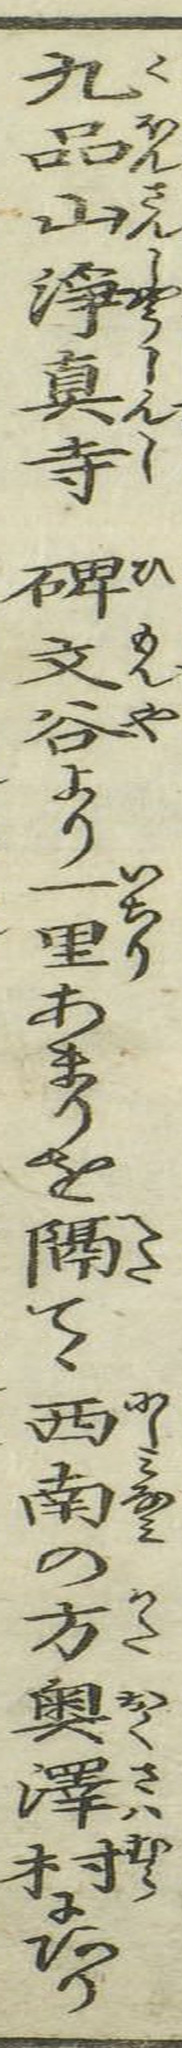九品山淨真寺碑文谷より一里あまりを隔てゝ西南の方奥澤村にあり

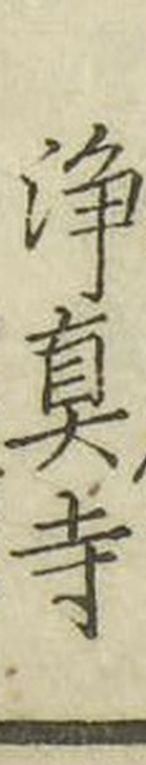淨真寺
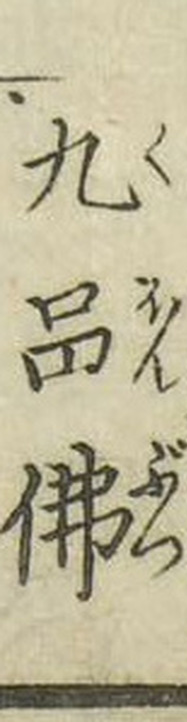九品佛

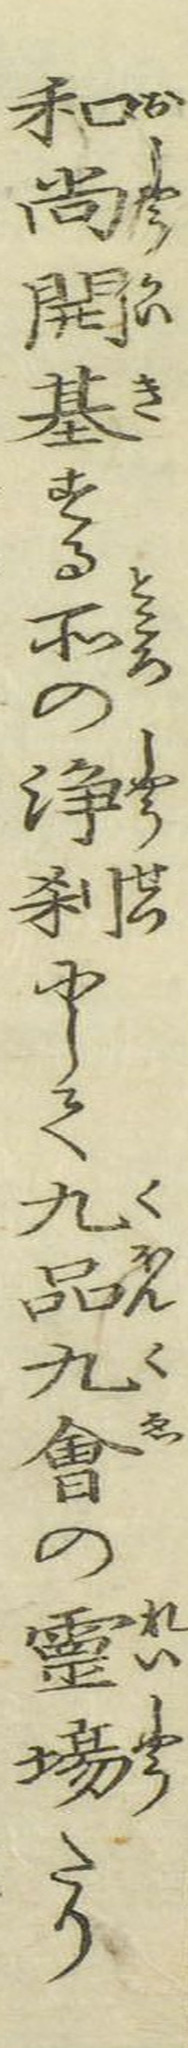和尚開基する所の淨刹にして九品九會の靈塲たり
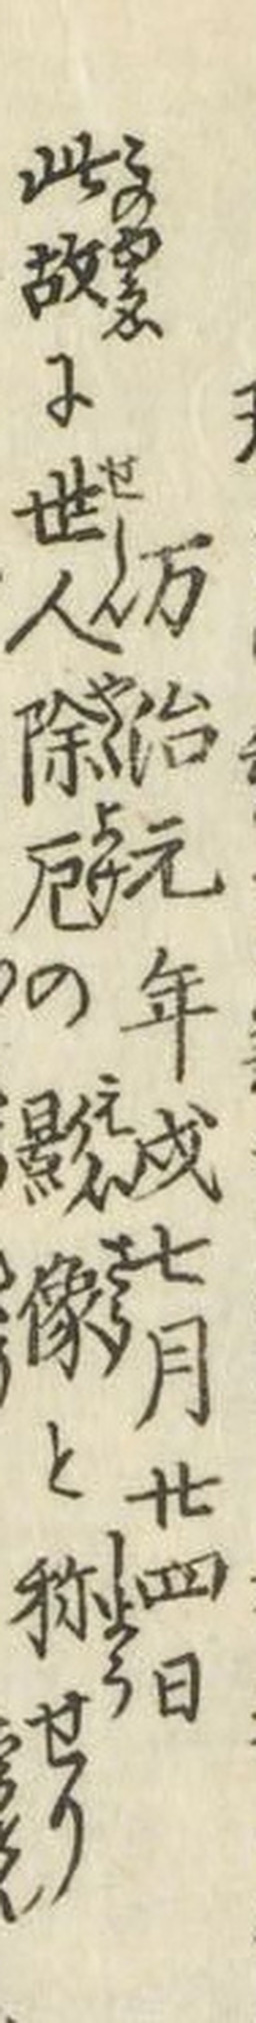此故に世人除厄の影像と称せり
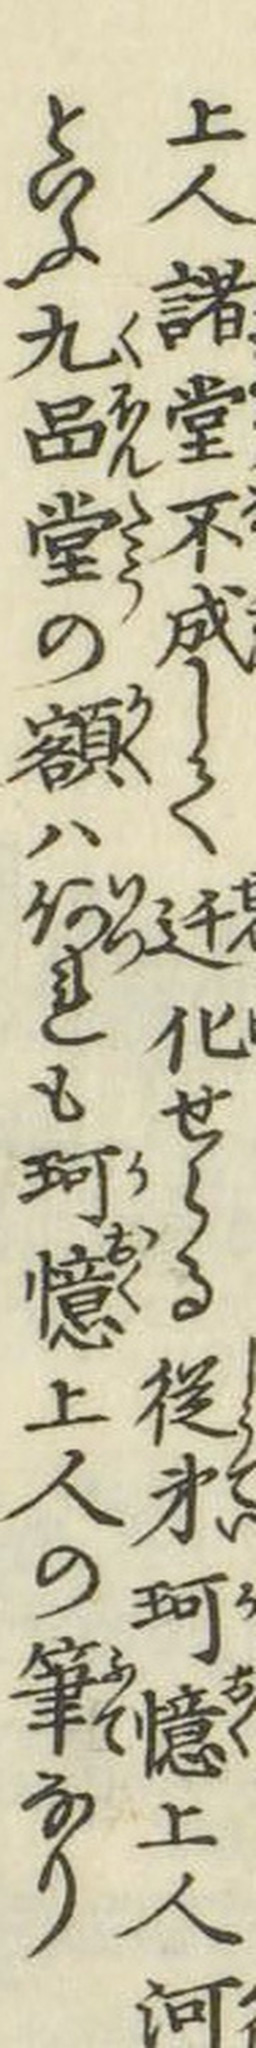といふ九品堂の額は何れも珂憶上人の筆なり

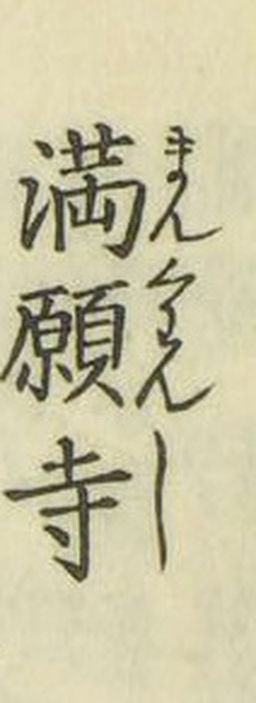万願寺
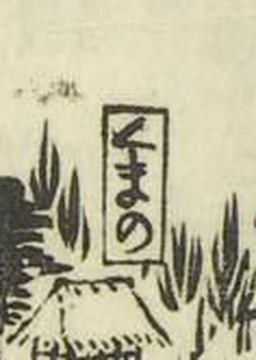くまの

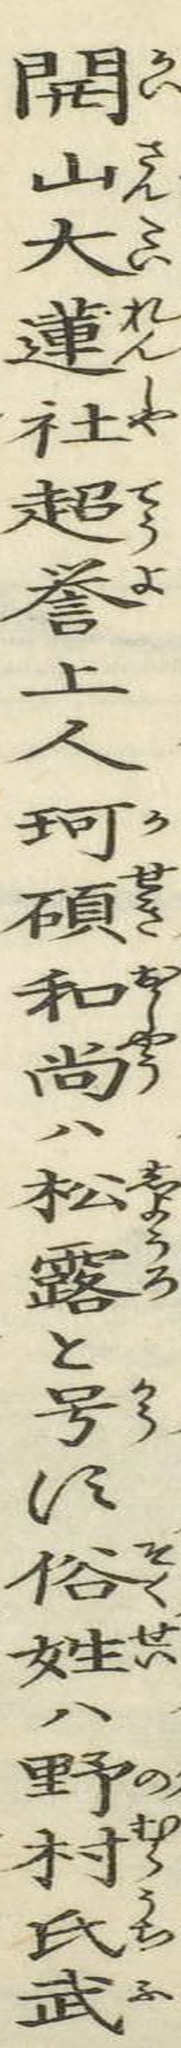開山大蓮社超誉上人珂碩和尚は松露と号す俗姓は野村氏武
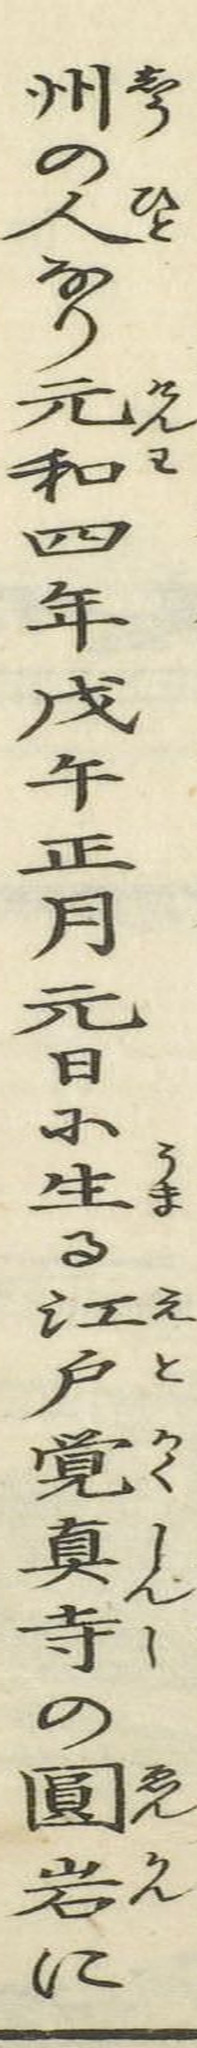州の人なり元和四年戊午正月元日に生る江戸覚真寺の圓岩に
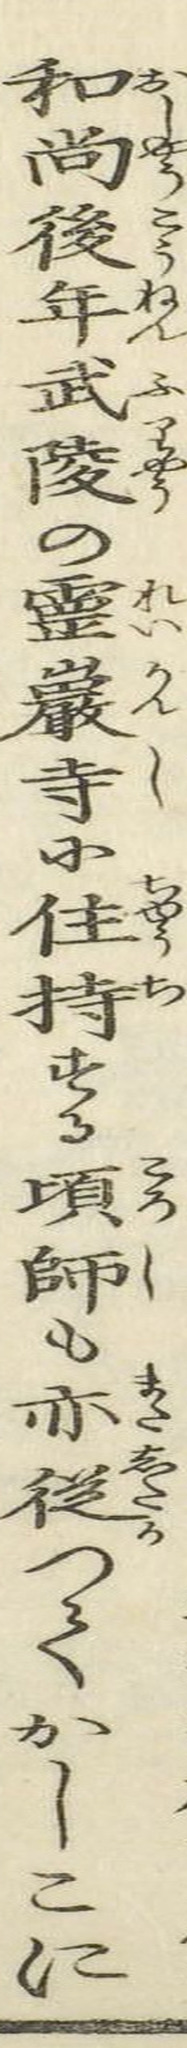和尚後年武陵の靈巖寺に住持する頃師も亦従つてかしこに
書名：江戸名所図会 20巻 巻之8
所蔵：東京学芸大学教育コンテンツアーカイブ
